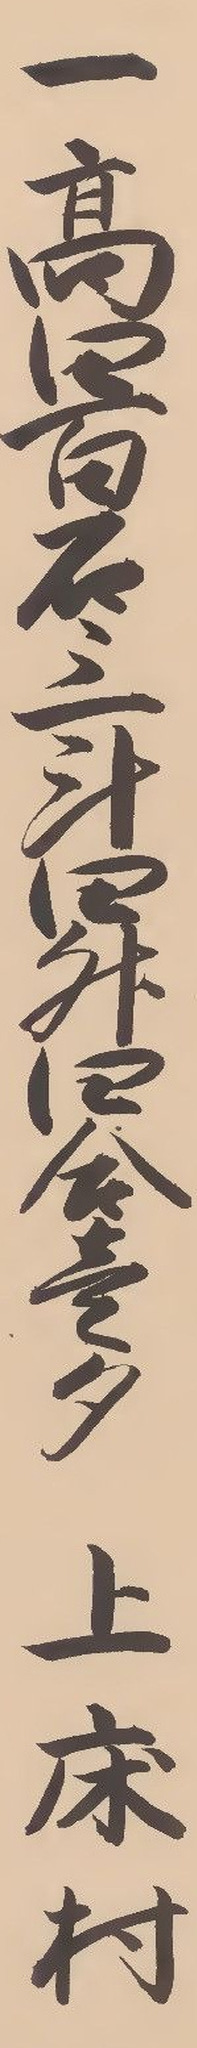一高四百石三斗四升四合壱勺上床村
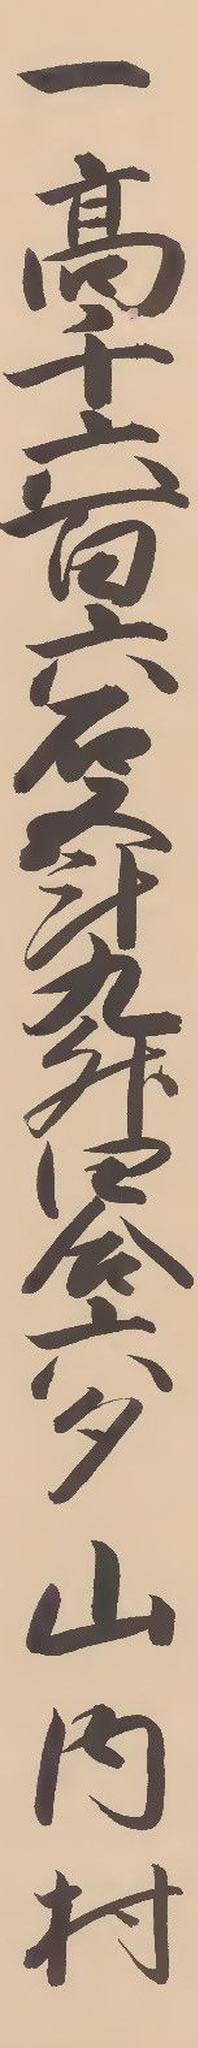一高千六百六石五斗九升四合六勺山内村
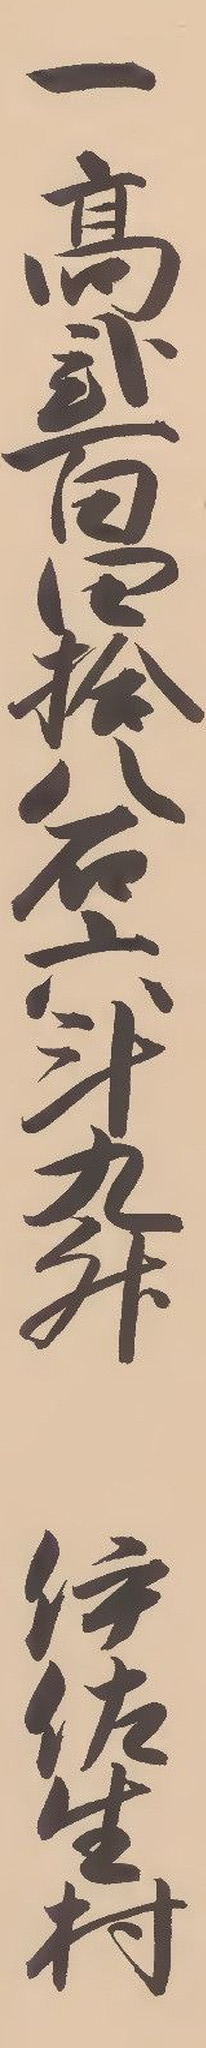一高弐百四拾八石六斗九升伊佐生村
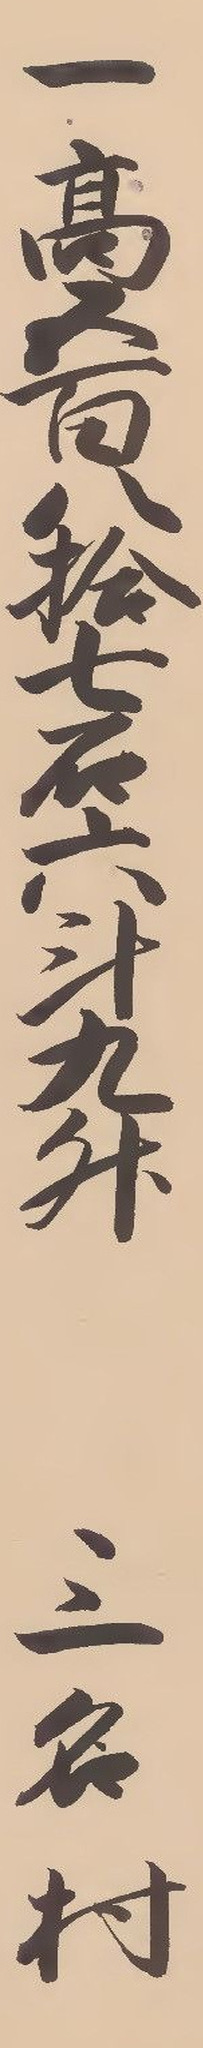一高五百八拾七石六斗九升三名村
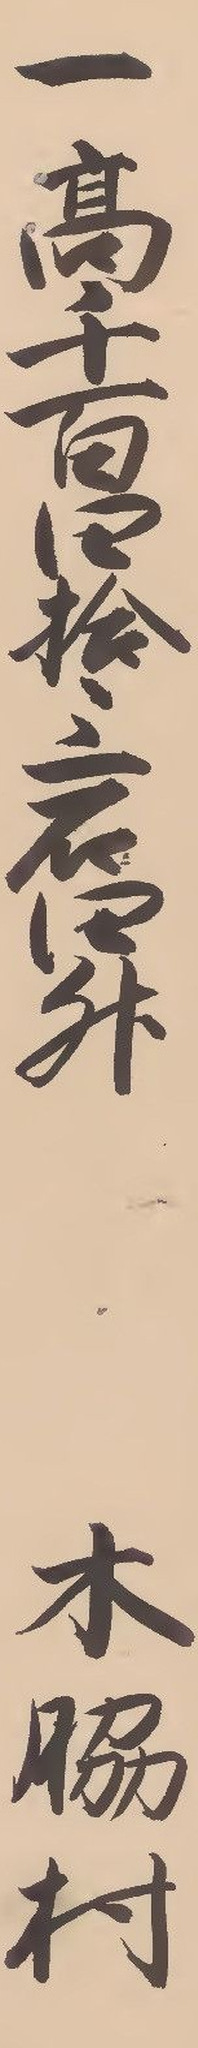一高千百四拾三石四升木脇村
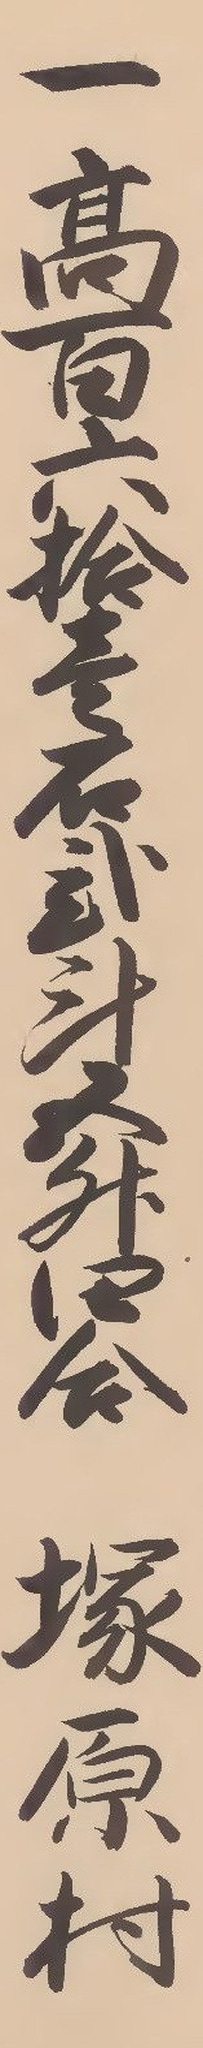一高百六拾壱石弐斗五升四合塚原村
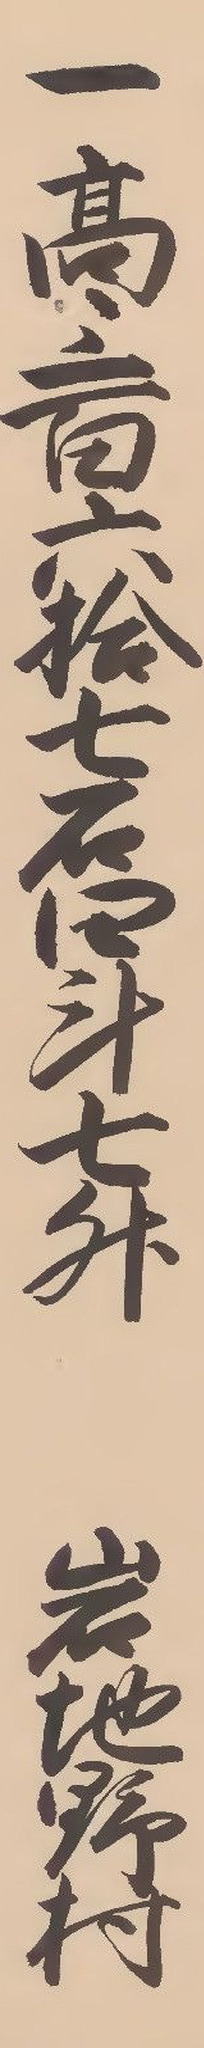一高三百六拾七石四斗七升岩地野村
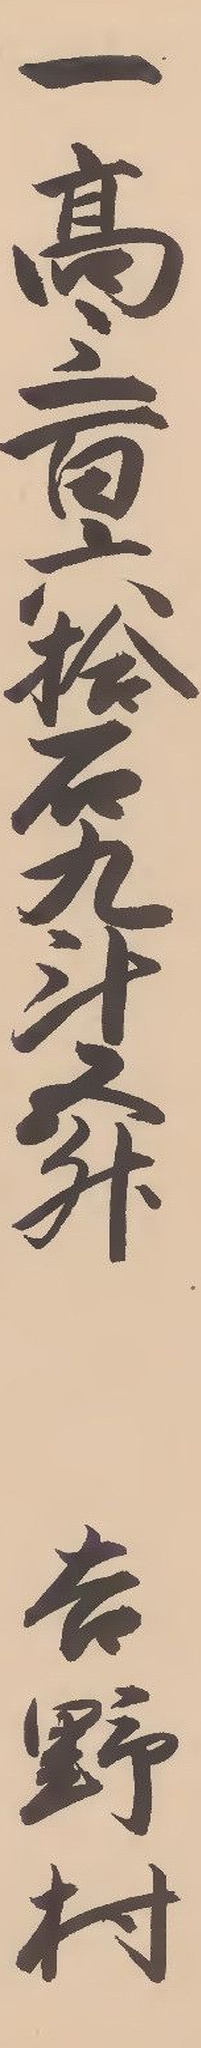一高三百六拾石九斗五升吉野村

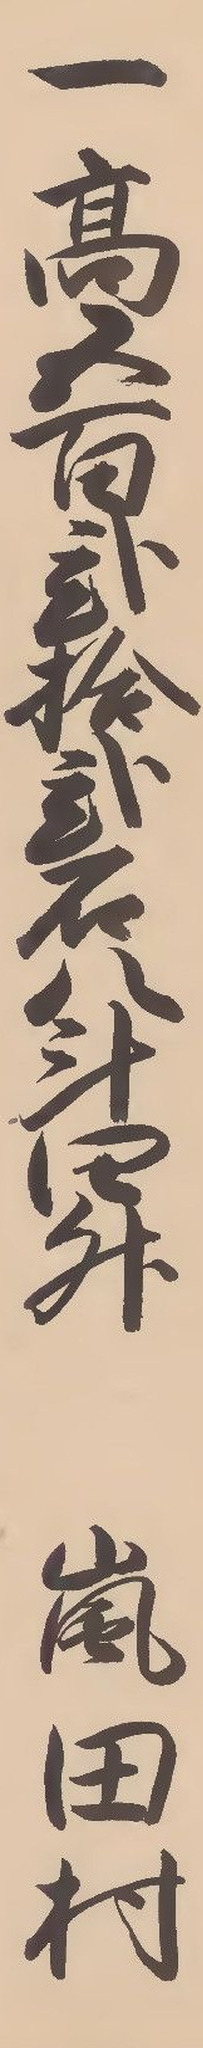一高五百弐拾弐石八斗四升嵐田村
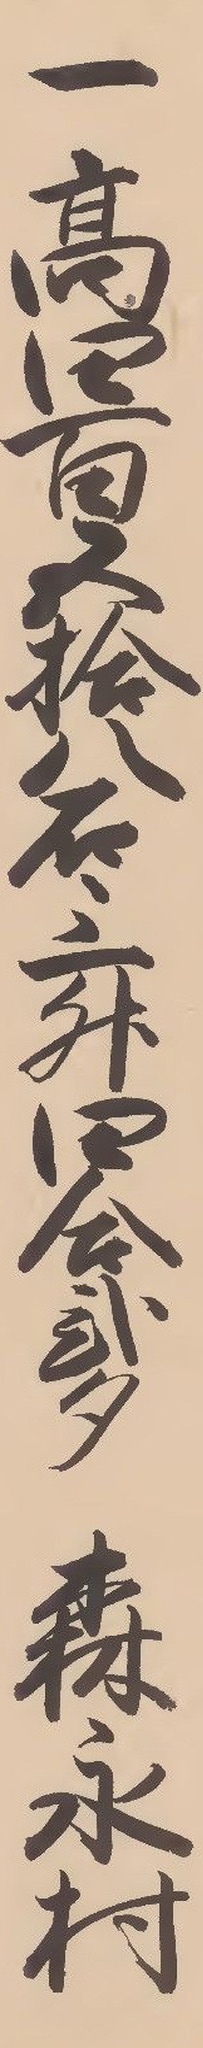一高四百五拾八石三升四合弐勺森永村
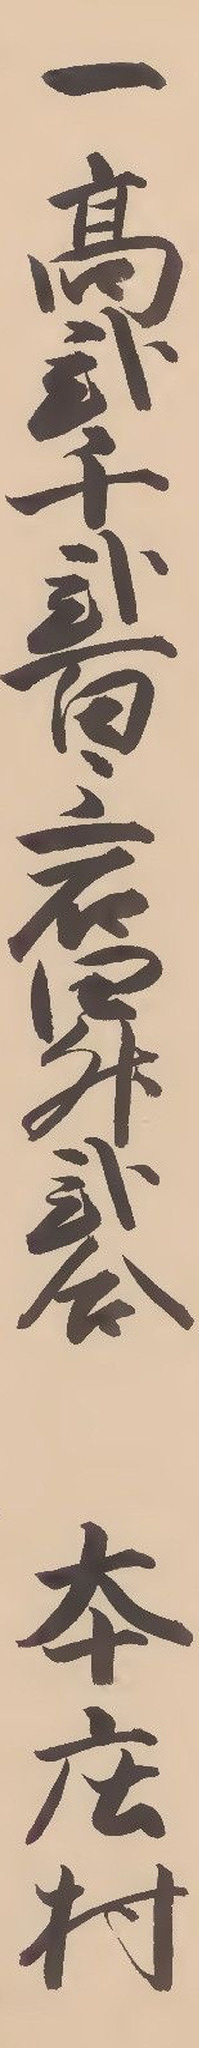一高弐千弐百三石四升弐合本庄村
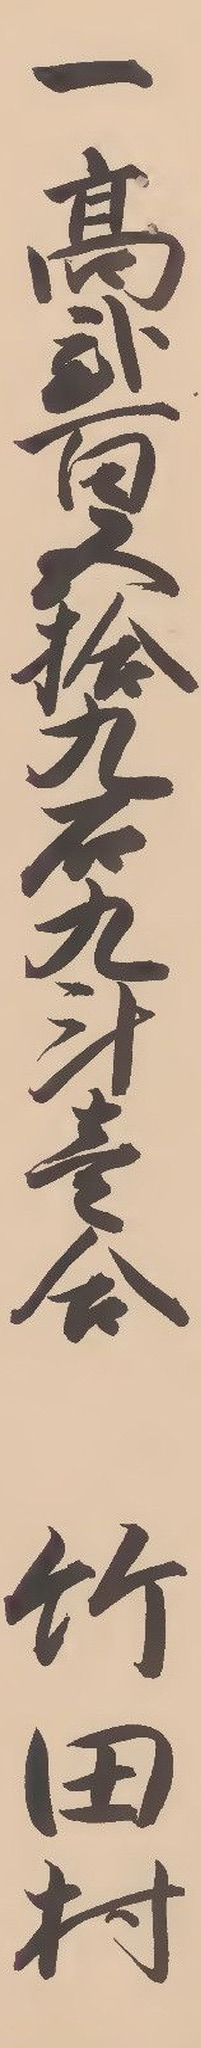一高弐百五拾九石九斗壱合竹田村
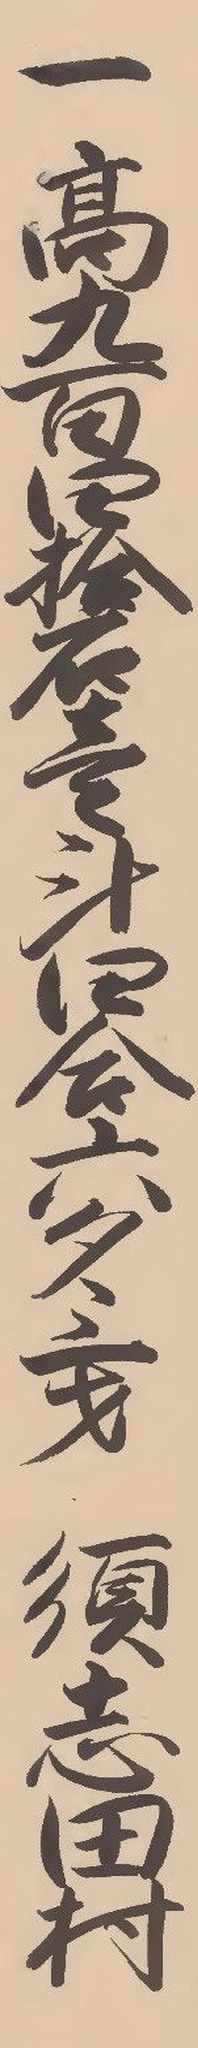一高九百四拾石壱斗四合六勺三才須志田村
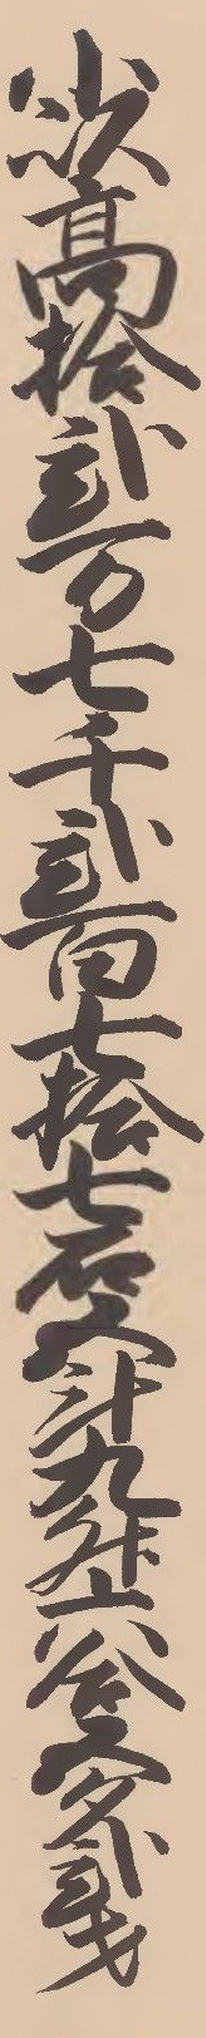小以高拾弐万七千弐百七拾七石五斗九升六合五勺弐才

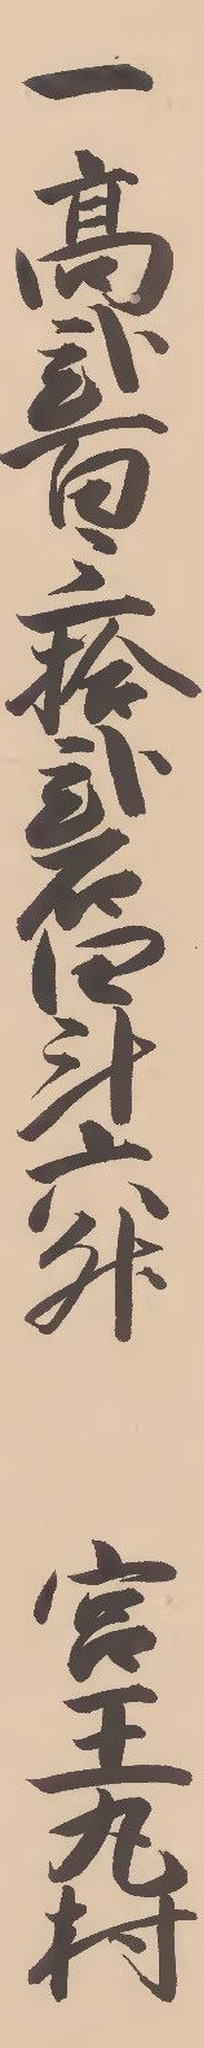一高弐百三拾弐石四斗六升宮王丸村
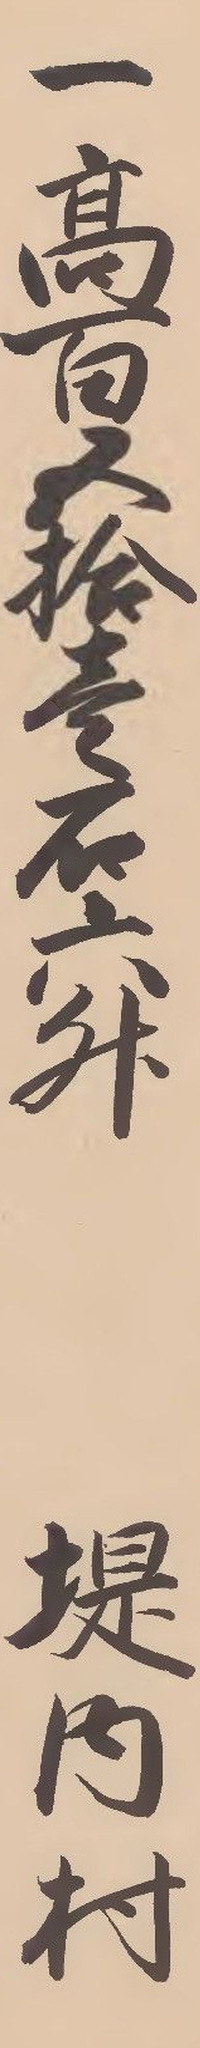一高百五拾壱石六升堤内村
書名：日向国郷帳
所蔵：国立公文書館 National Archives of Japan
